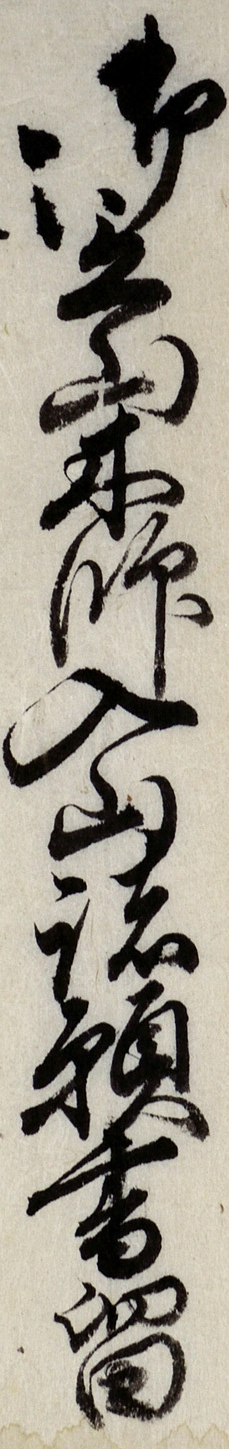御立山木師入山諸願書留
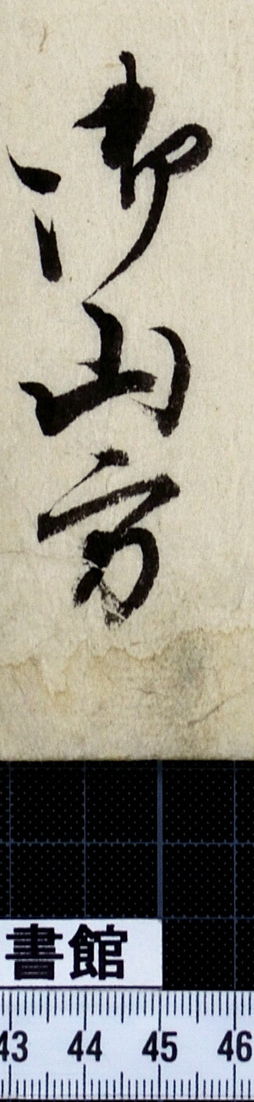御山方
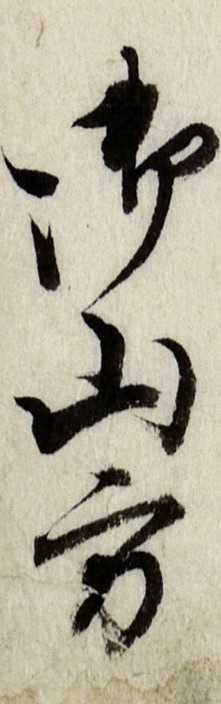御山方
